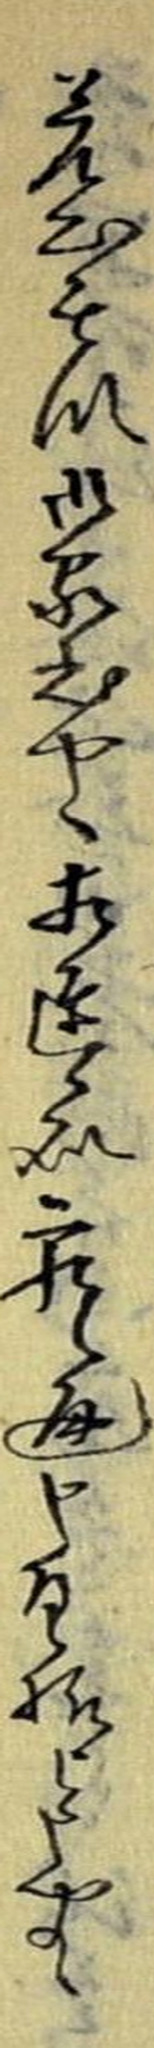差出其段御家老中へ相達候処願之通申付候様被申聞候
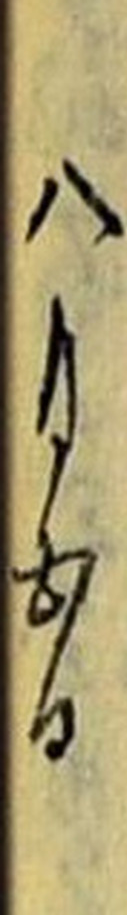八月五日
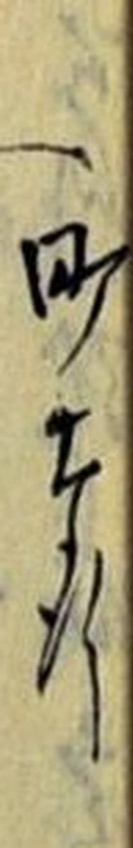町奉行
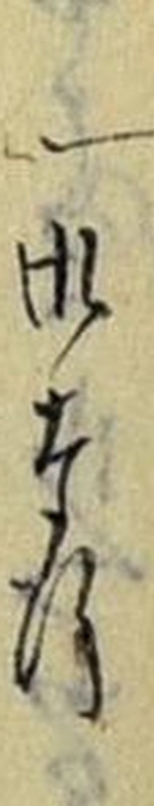御奉行
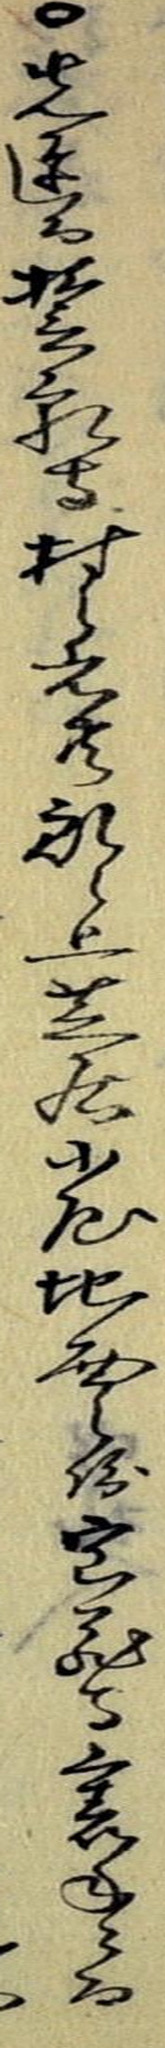〇先達而誓願寺村之者共願之上芝居小屋地面之儀宝蔵寺裏手ニ而
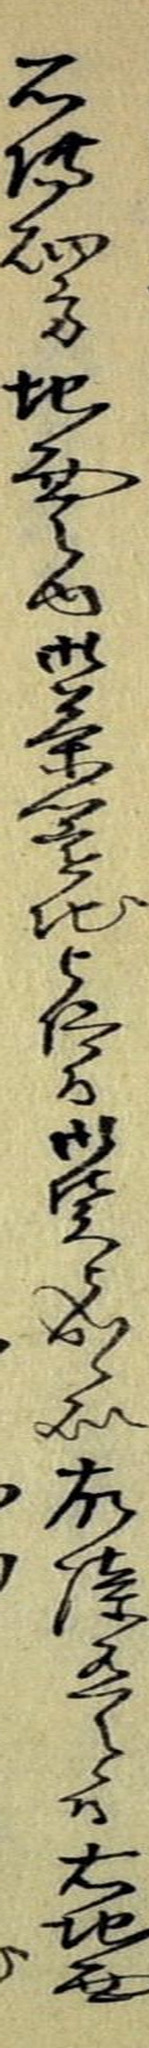石場畑方地面之内御茶薗地被仰付御貸被成候処故障有之ニ付右地面
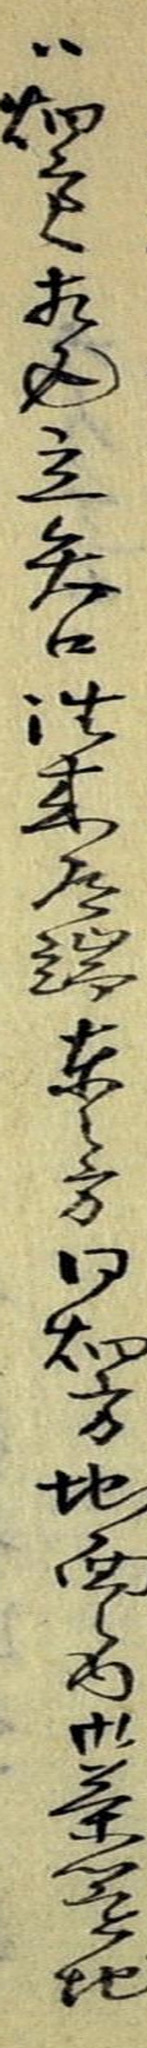ハ畑方へ相返立矢口往来道端東之方同畑方地面之内御茶薗地
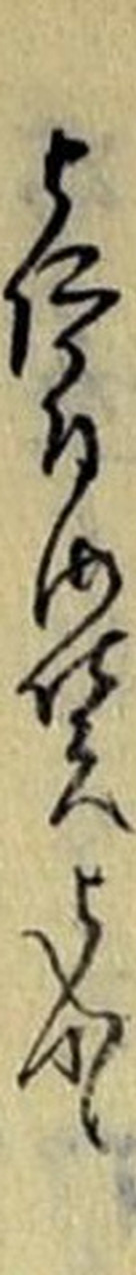被仰付御貸被成候
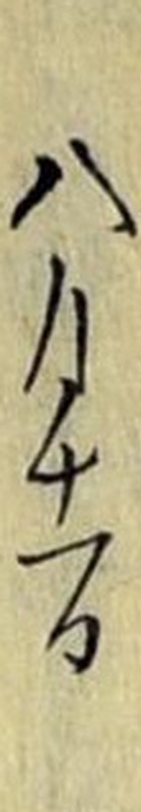八月十一日
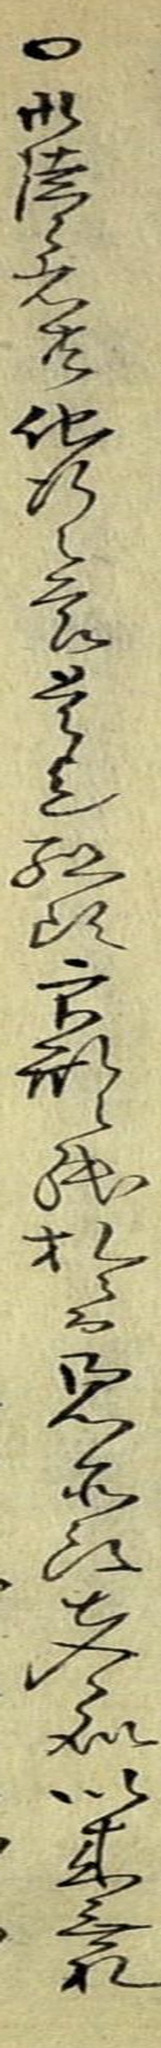〇御徒之者共他行之節是迄組頭印形之紙札ニ而御門所致出入候処以来無札
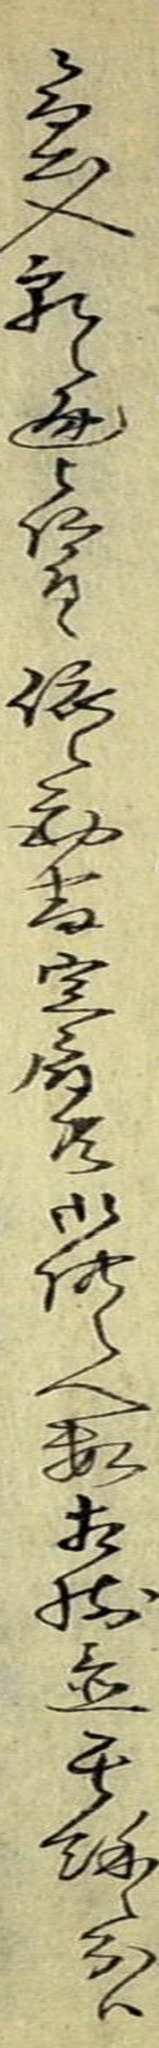ニ而出入願之通被仰付候依之勤番定雇共御供之人数相揃置其余之分ハ
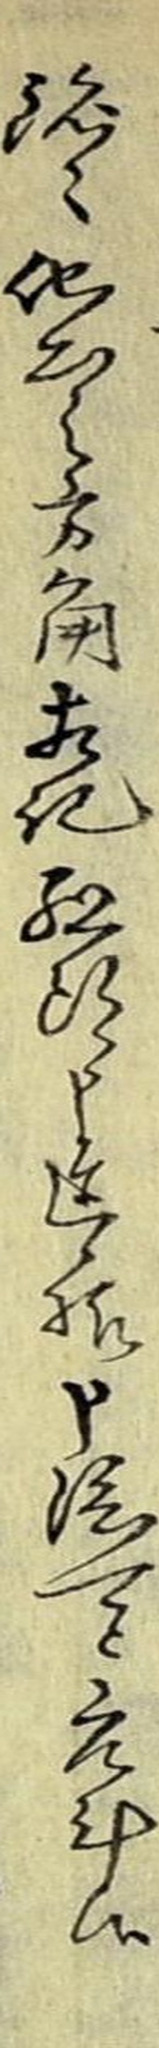銘々他出之方角相糺組頭申達候様申渡可被取計候
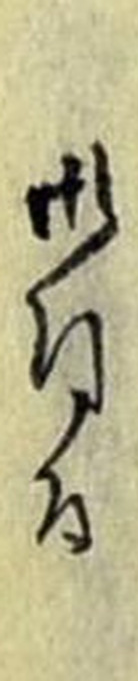御目付
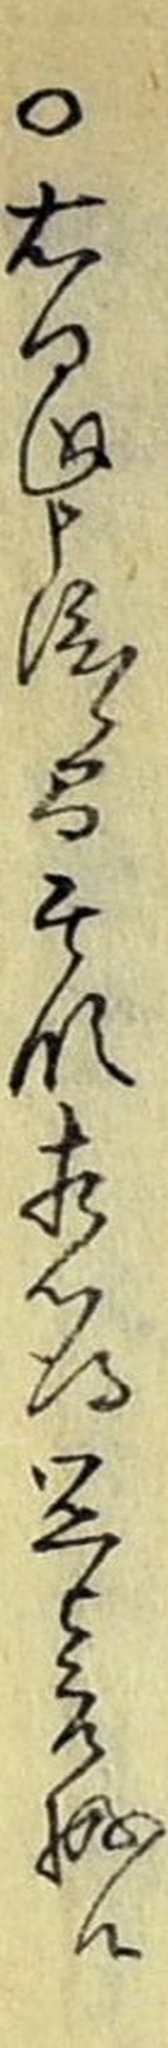〇右同趣申渡候間其段相心得被宜被取扱候
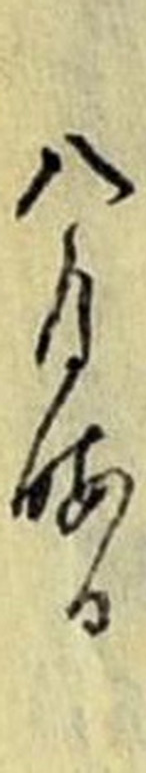八月晦日

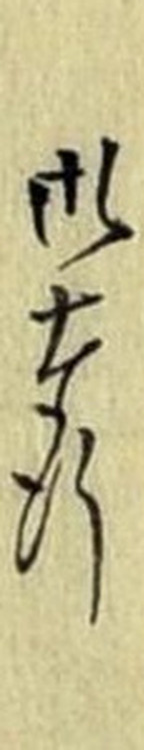御奉行
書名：命令之部 五
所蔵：福井県文書館 Fukui Prefectural Archives
